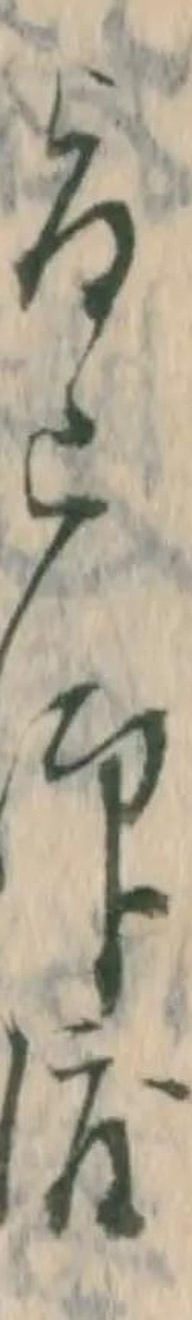旨被仰渡
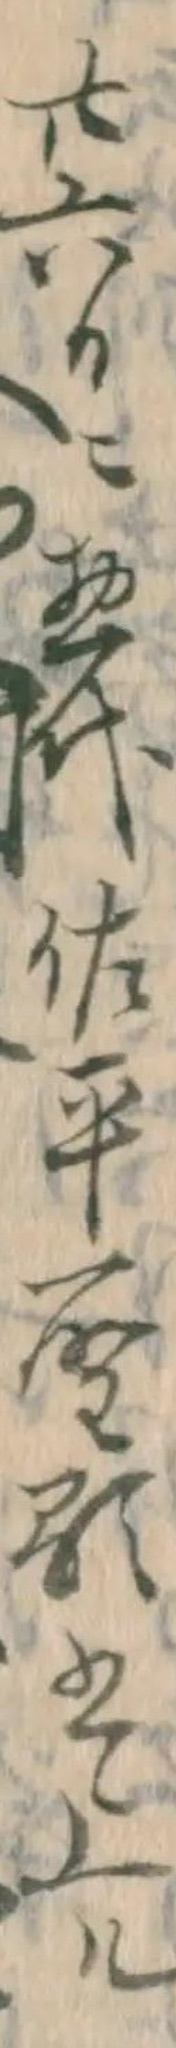廿六日ニ惣代佐平聖顕書上ル
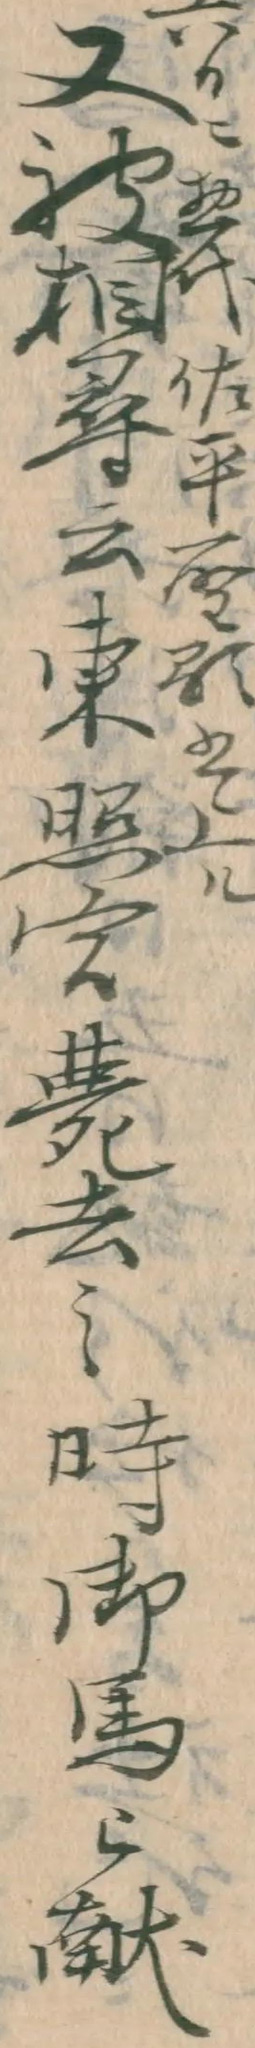又被相尋云東照宮薨去之時御馬被献
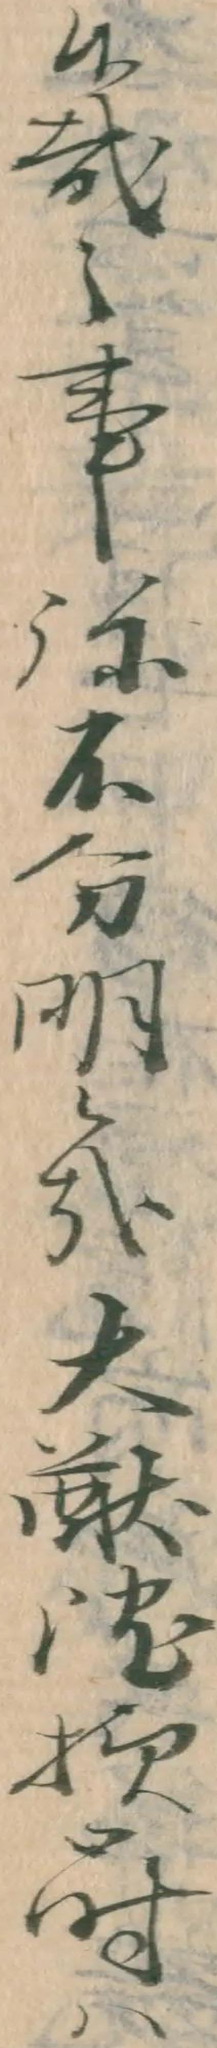候哉之事弥不分明候哉大猷院様御時ハ
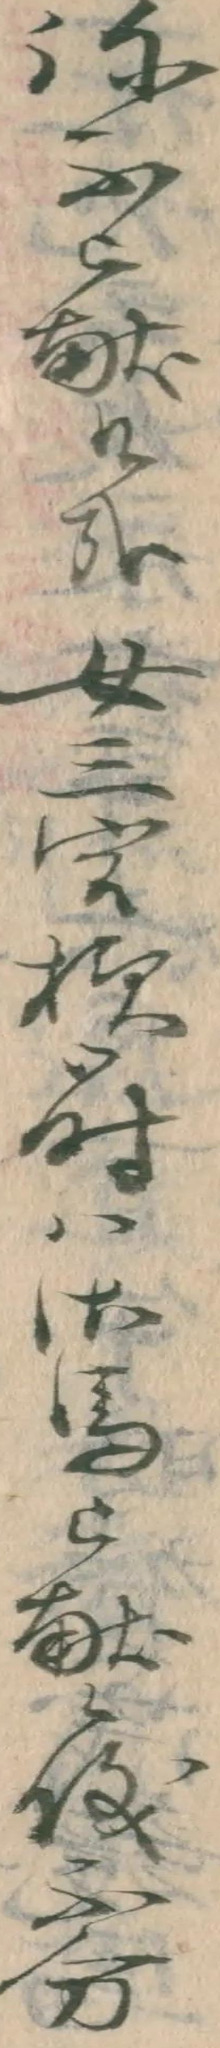弥不被献候哉女三宮様御時ハ御馬被献候儀不分
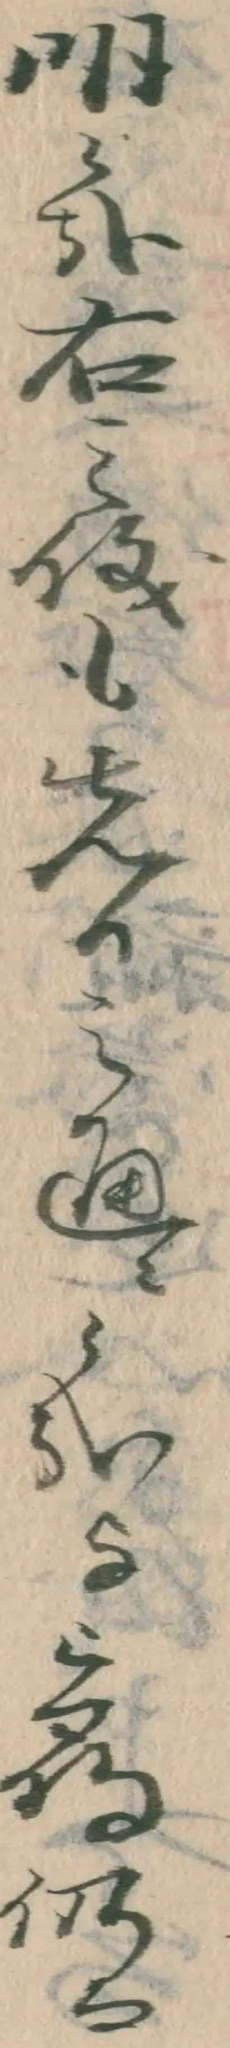明候哉右之儀も先日之通ニ候哉と被尋仍而
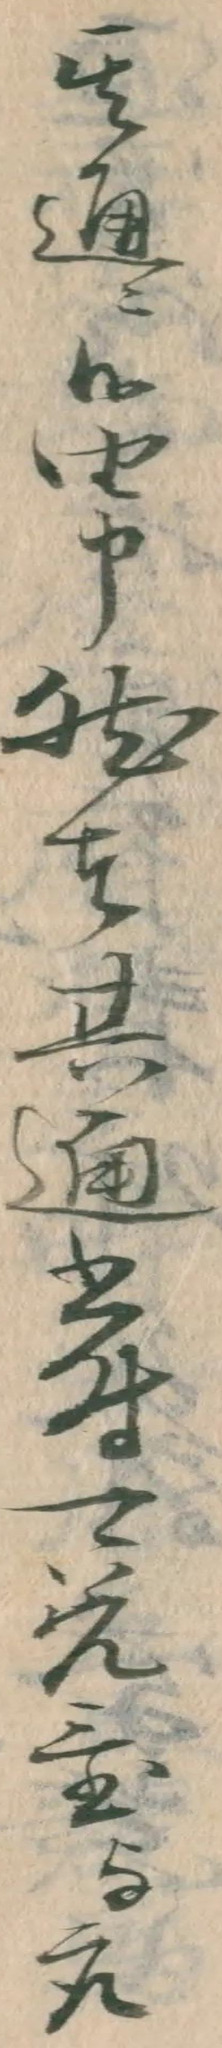其通ニ候由申然者其通書付可差置と取
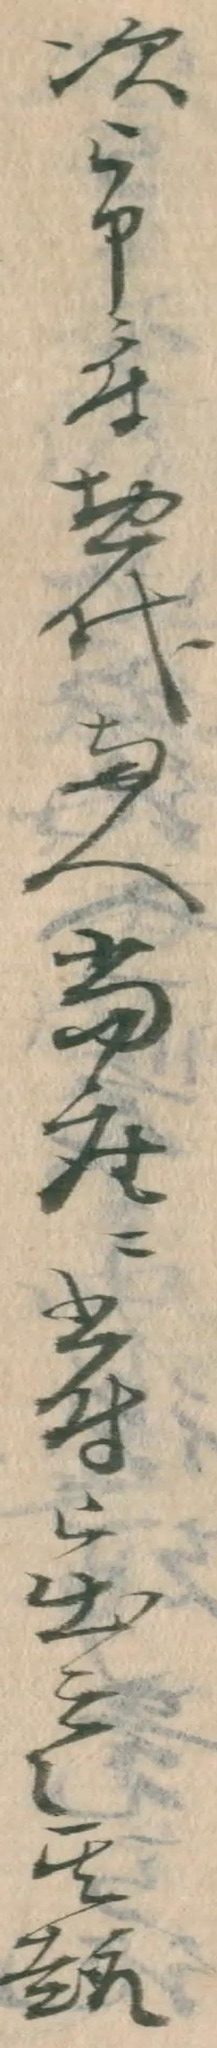次被申ニ付惣代両人当座ニ書付被出云々其趣
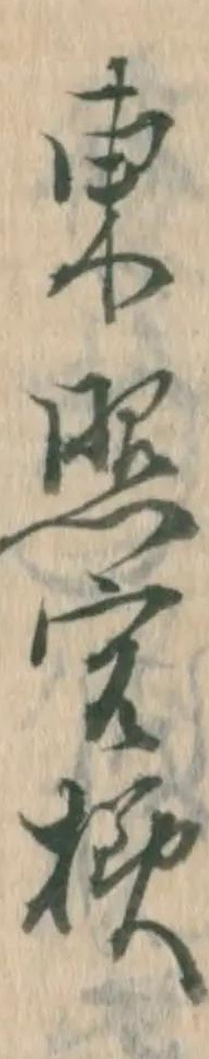東照宮様
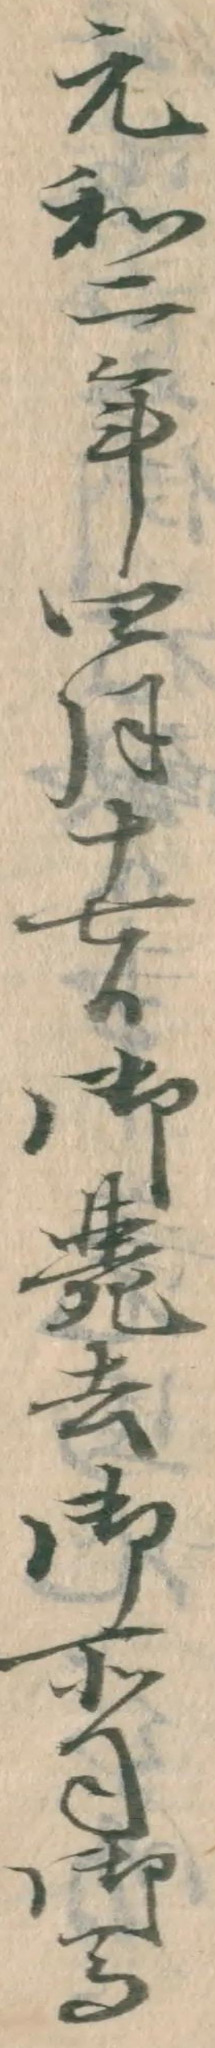元和二年四月十七日御薨去御所司御馬
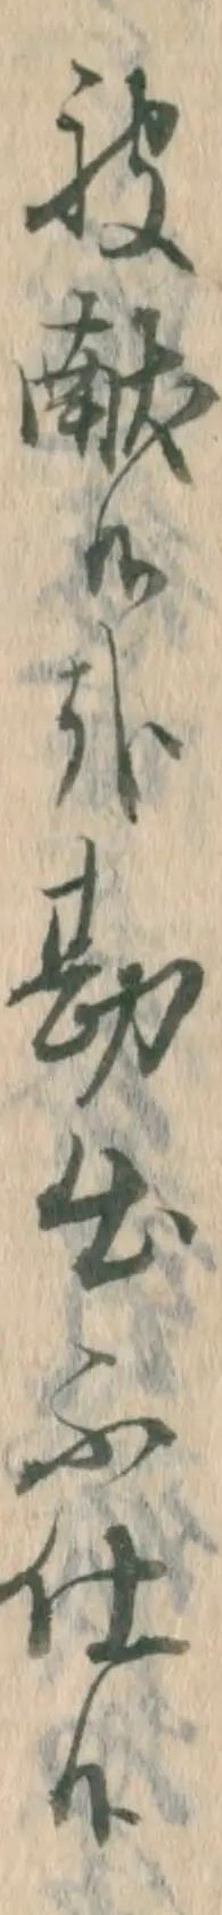被献候哉勘出不仕候
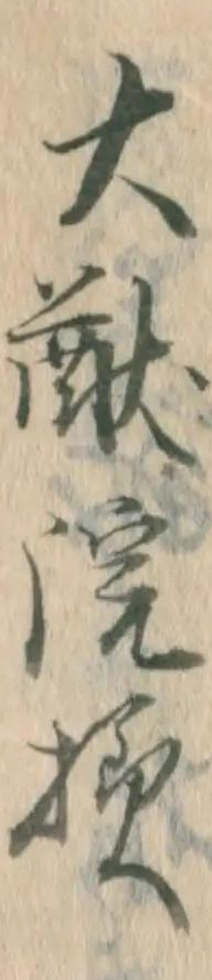大猷院様
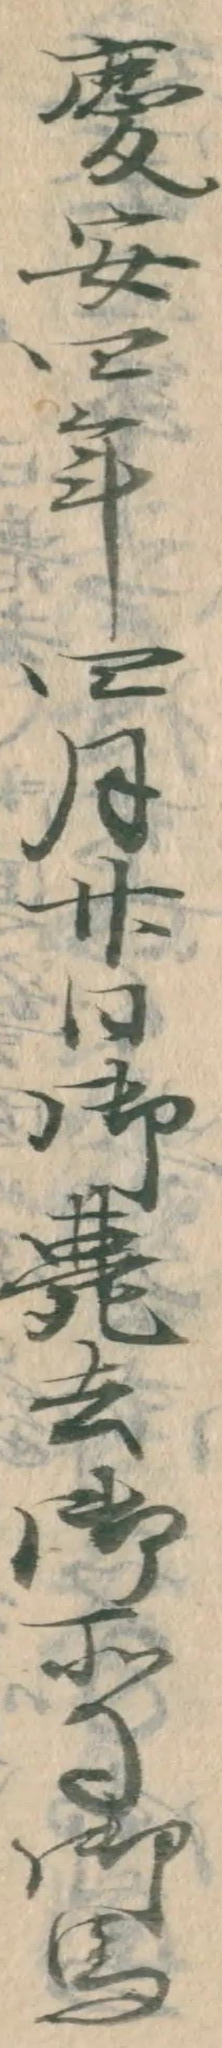慶安四年四月廿日五御薨去御所司御馬
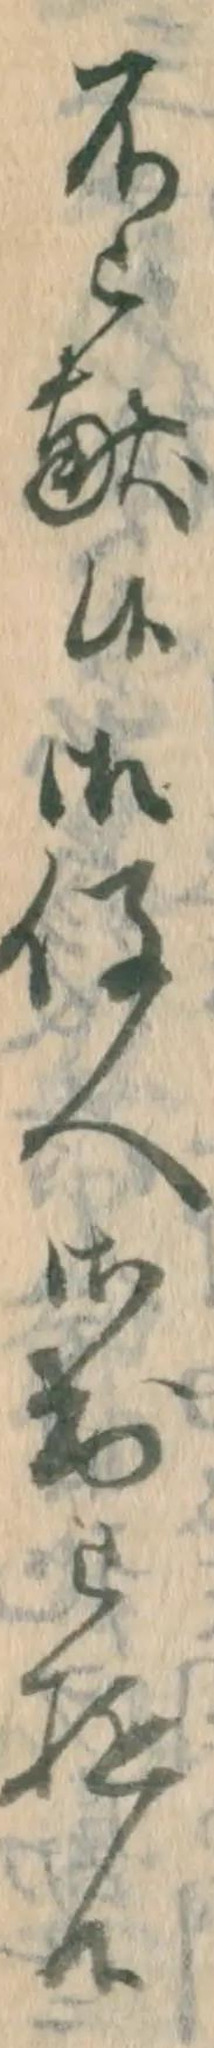不被献候御役人お御出被遊候

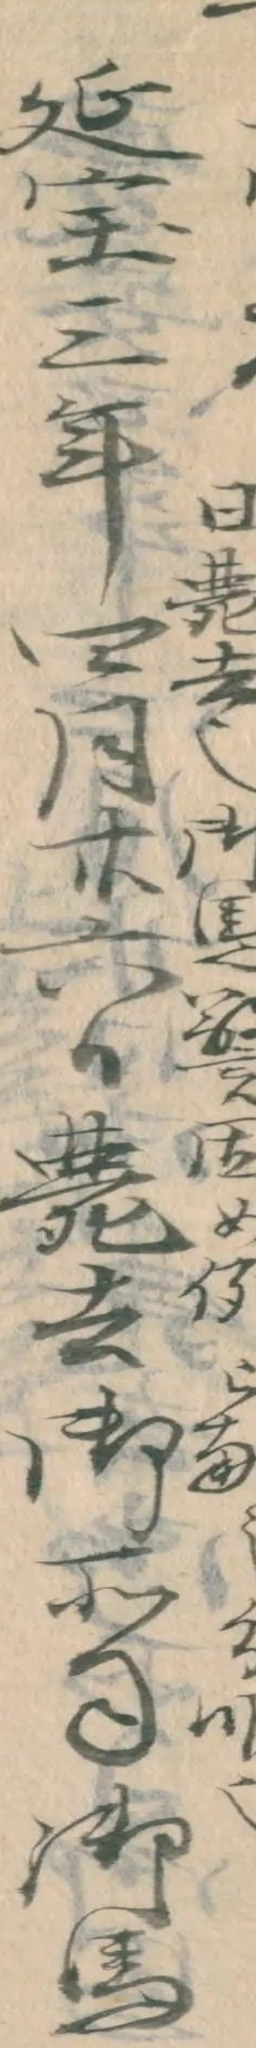延宝三年四月廿六日薨去御所司御馬
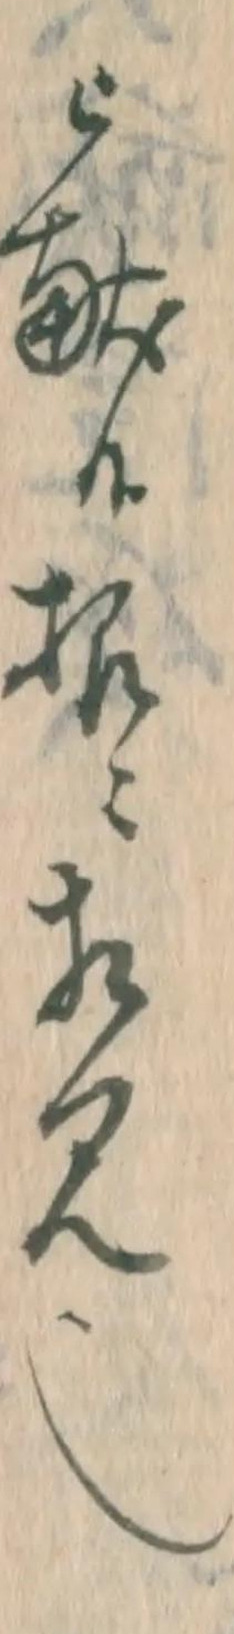被献候様ニ相見也
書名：賀茂社記録. 第10冊
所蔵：国立国会図書館 National Diet Library, JAPAN
